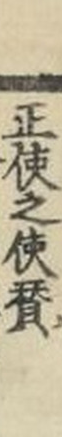正使之使賛
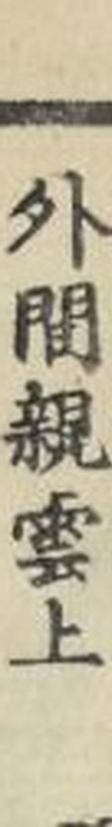外間親雲上
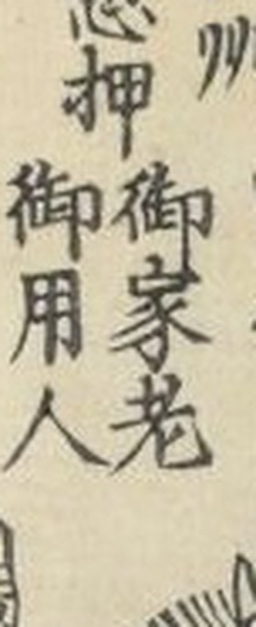御用人
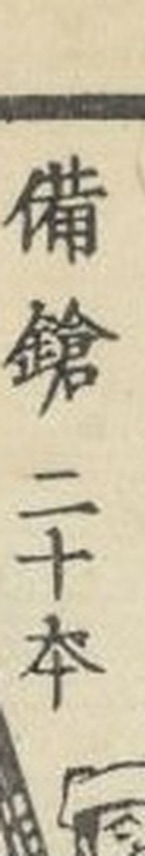備鎗二十本
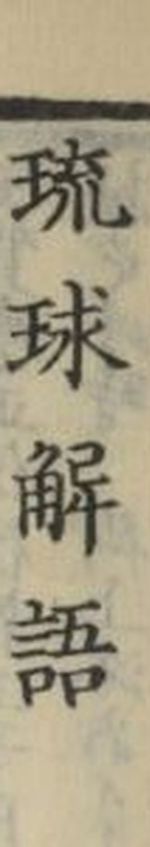琉球解語
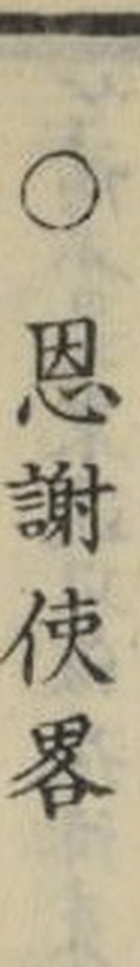○恩謝使略
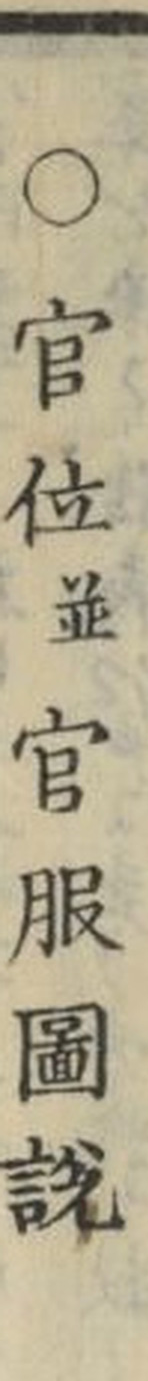○官位並官服図説
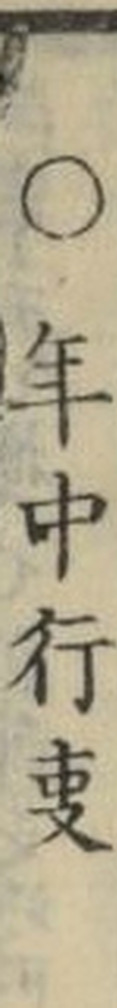○年中行事
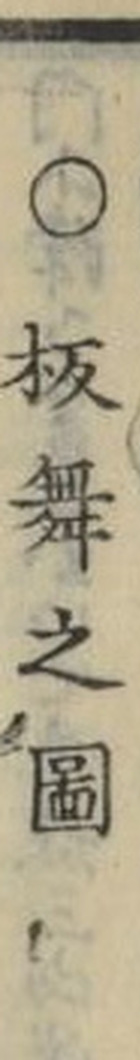○板舞之図
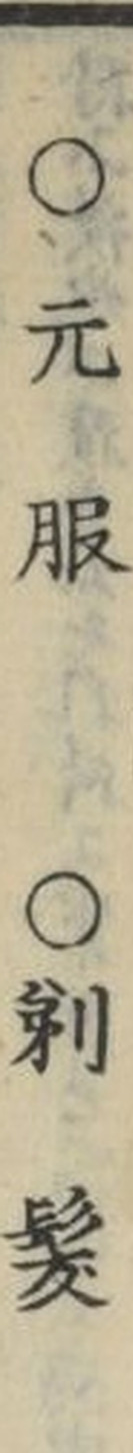○元服○剃髪
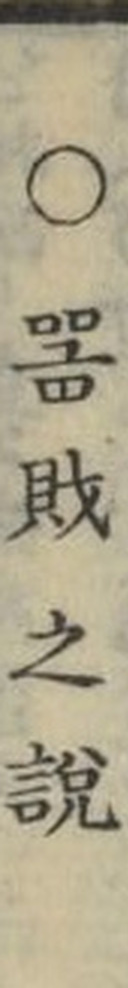○器財之説
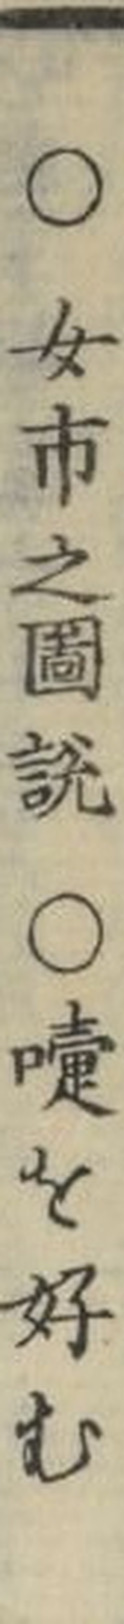○女市之図説○嚏を好む
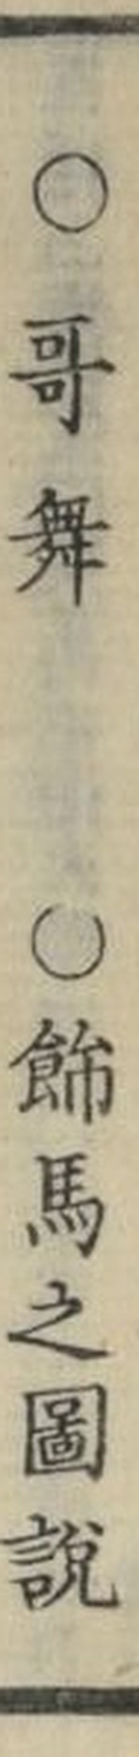○哥舞○飾馬之図説
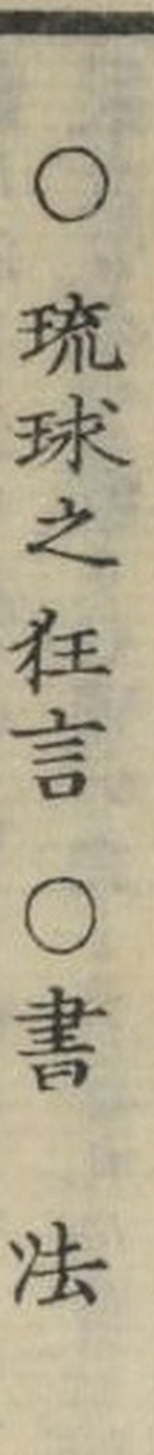○琉球之狂言○書法
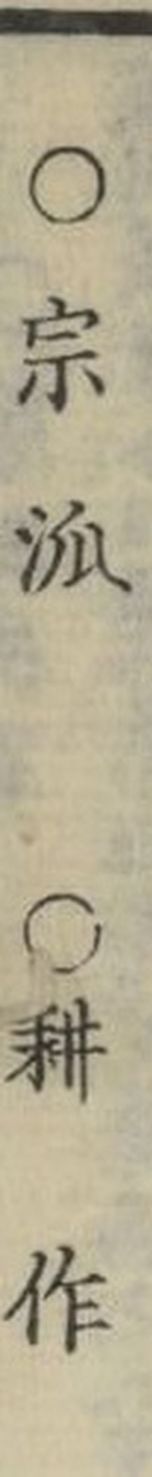○宗派○耕作
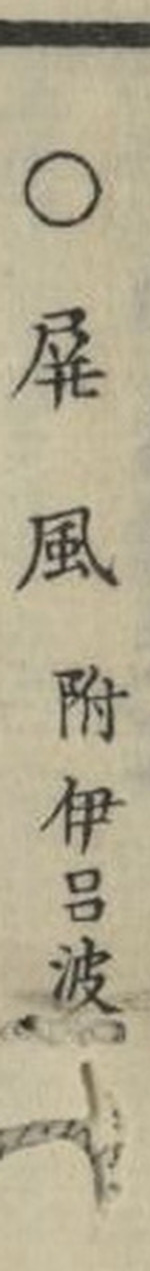○屏風附伊呂波
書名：琉球解語
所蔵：University of the Ryukyus Library
